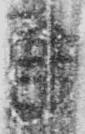唯（雖）
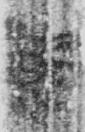難
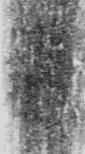不
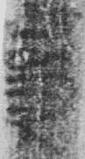貴
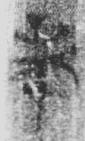未
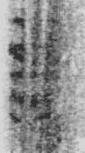言
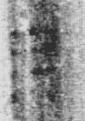而
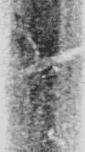○（信）
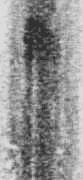又（有）
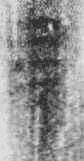𡵂（美）
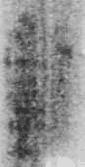情
